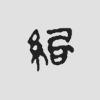紀
